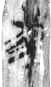南
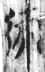凥（居）
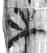之
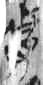貴
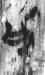凡
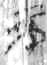不
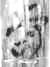可
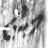㠯（以）
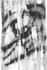盍（蓋）
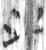之
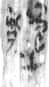牆
